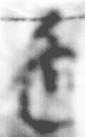哀
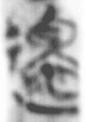還
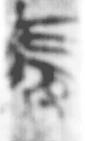馭（御）
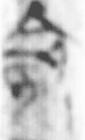命（令）
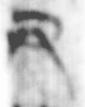尹
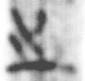之
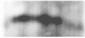一
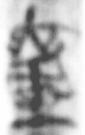𨍱（乘）
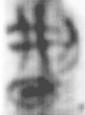○（輕）
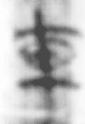車
